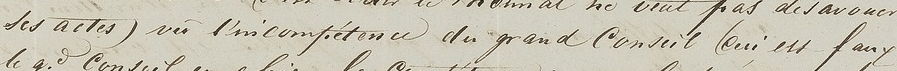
ses actes), vu l'incompétence du grand Conseil» (ceci est faux
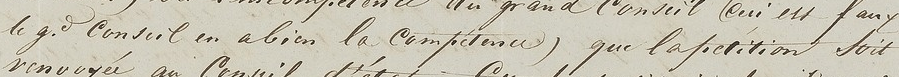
le gd Conseil en a bien la compétence) que la pétition soit
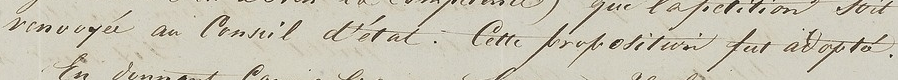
renvoyée au Conseil d'état. Cette proposition fut adoptée
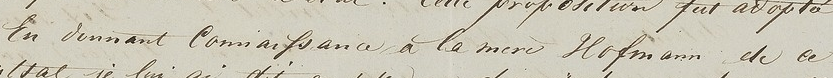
En donnant connaissance à la mère Hofmann de ce
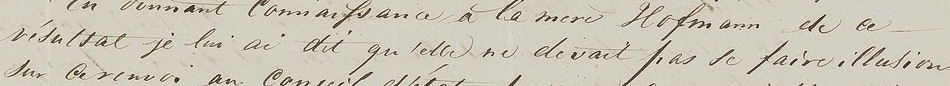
résultat je lui ai dit qu'elle ne devait pas se faire illusion
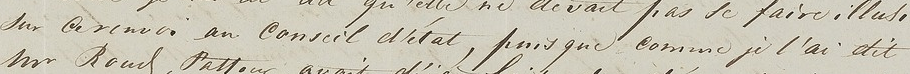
sur ce renvoi au Conseil d'état, puisque, comme je l'ai dit
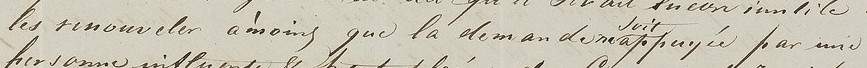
les renouveler à moins que la demande ne soit appuyée par une
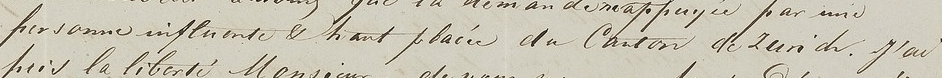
personne influente & tant placée du Canton de Zurich. J'ai
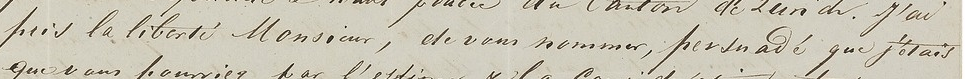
pris la liberté Monsieur, de vous nommer, persuadé que j'étais
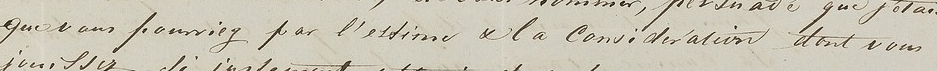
que vous pourriez par l'estime & la considération dont vous
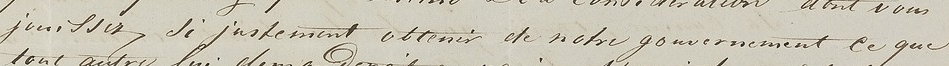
jouissez, si justement obtenir ne notre gouvernement ce que
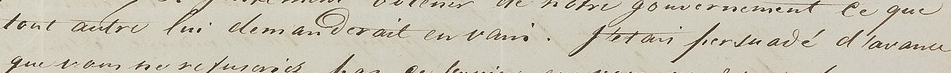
tout autre lui demanderait en vain. J'étais persuadé d'avance
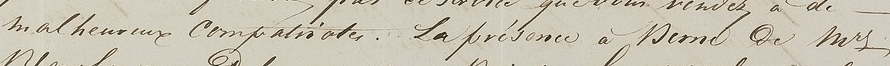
malheureux compatriotes. La présence à Berne de Mrs
